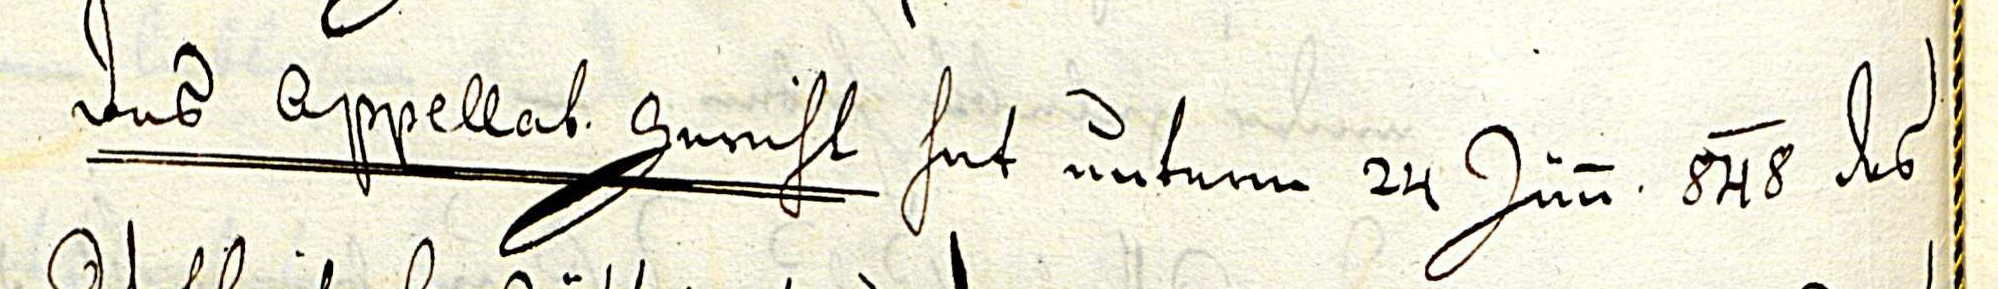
Das Appelat Gericht hat unterm 24 Jänn. 848 des
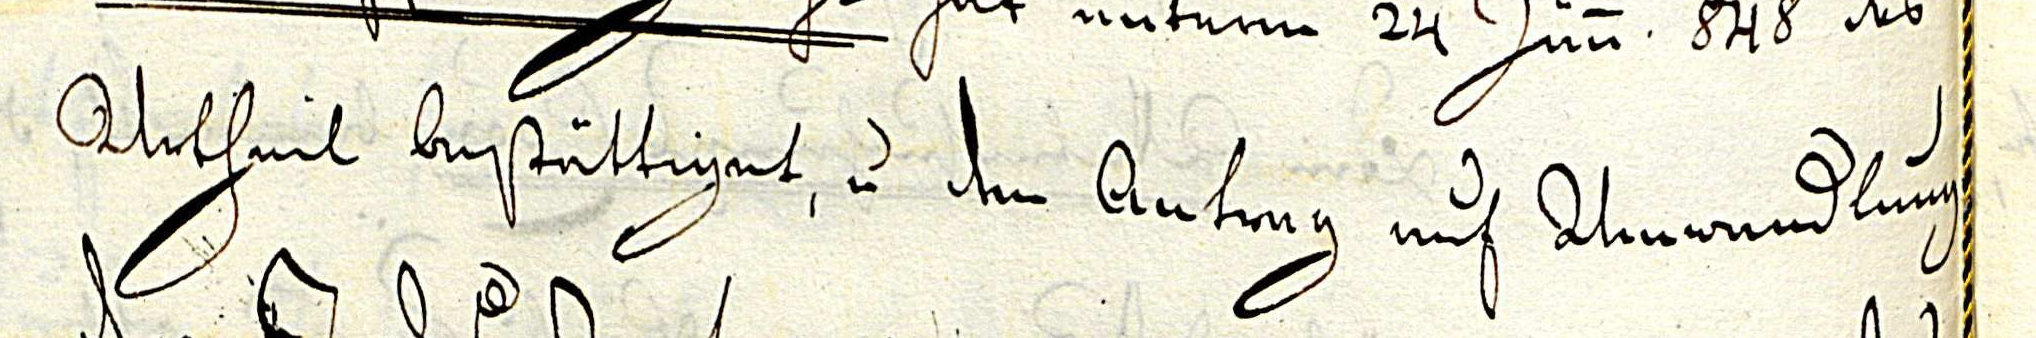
Urtheil bestättiget, u den Antrag auf Umwandlung
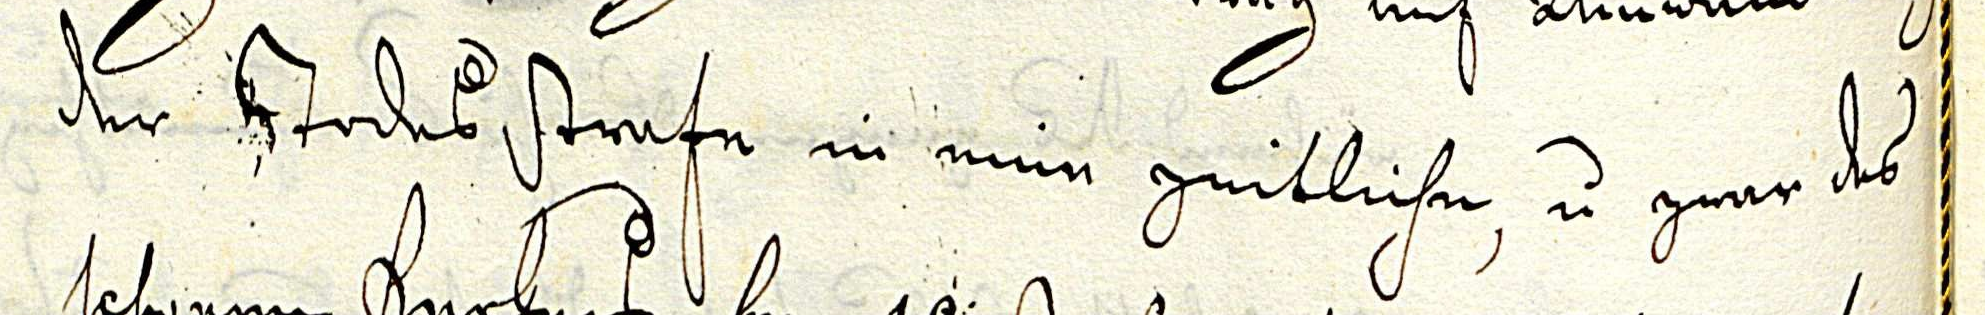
der Todesstrafe in eine zeitliche, u zwar des
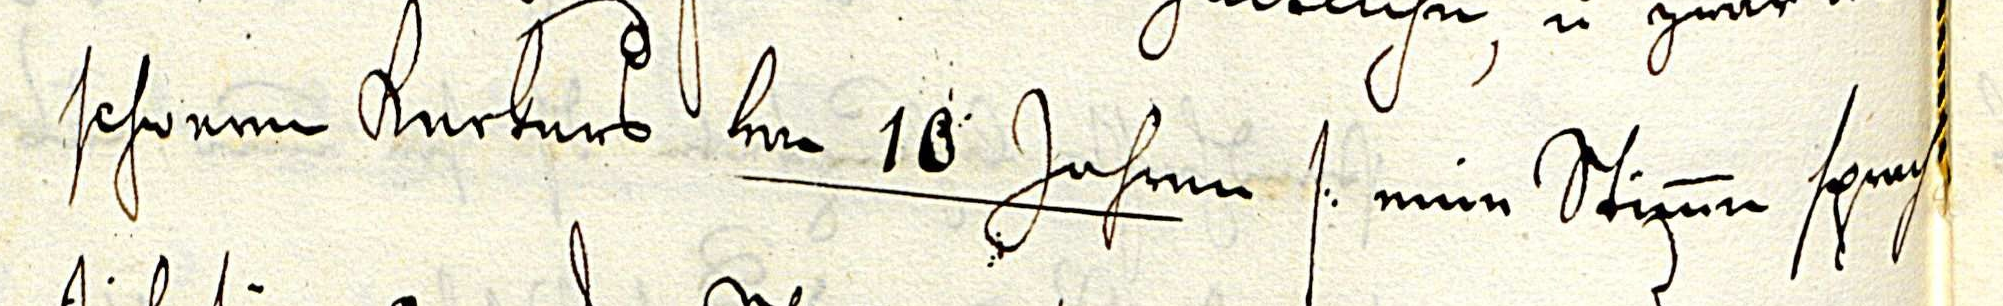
schweren Kerkers vom 10 Jahren (eine Stimme sprach
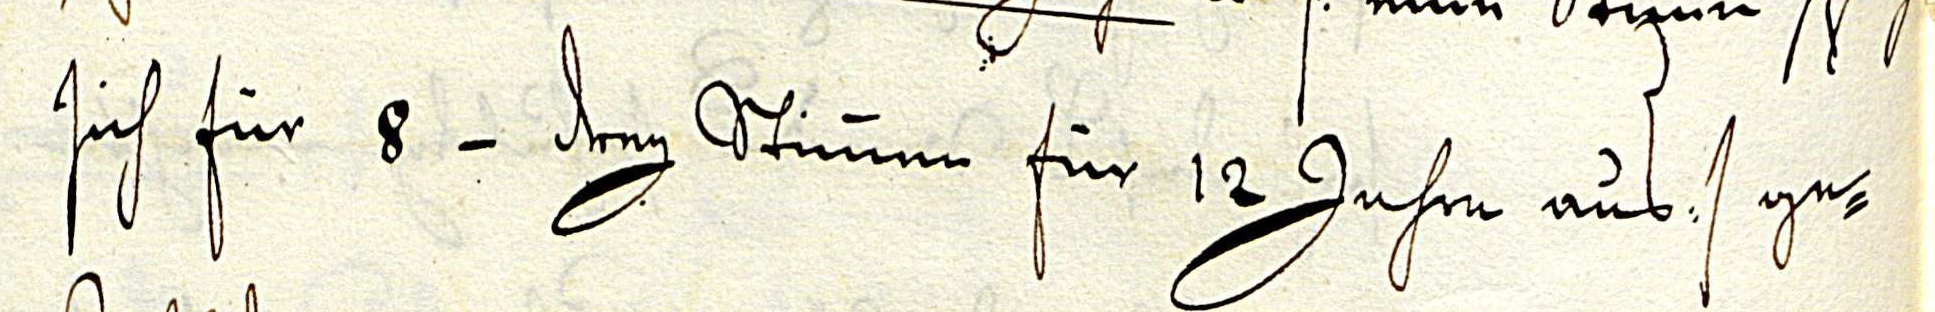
sich für 8 – drey Stimmen für 12 Jahre aus) ge¬
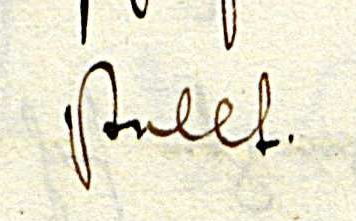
stellt.
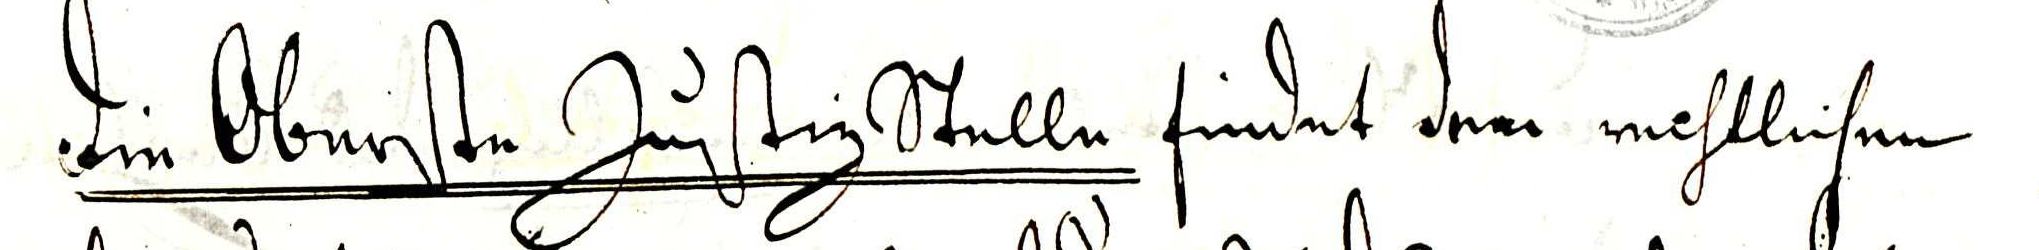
Die Oberste Justizstelle findet den rechtlichen
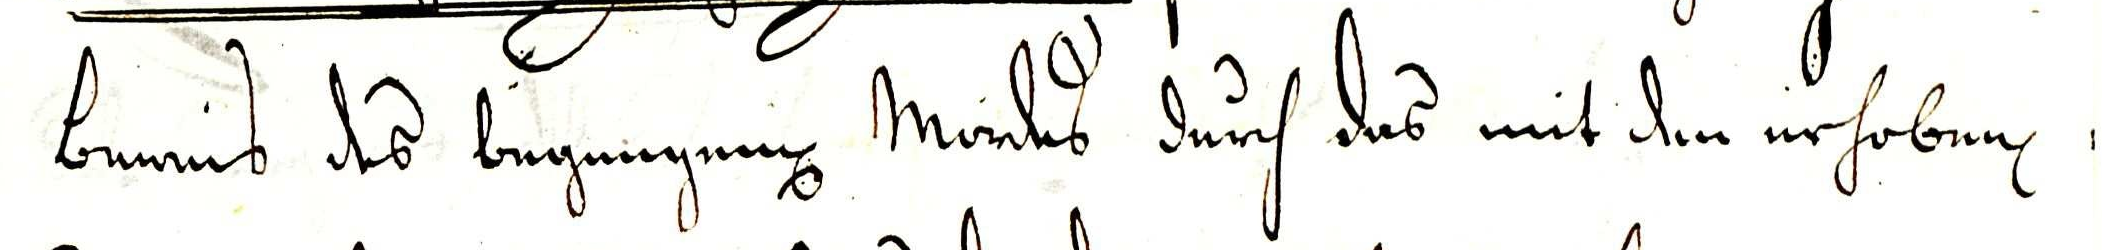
Beweis des begangenen Mordes durch das mit den Erhobenen
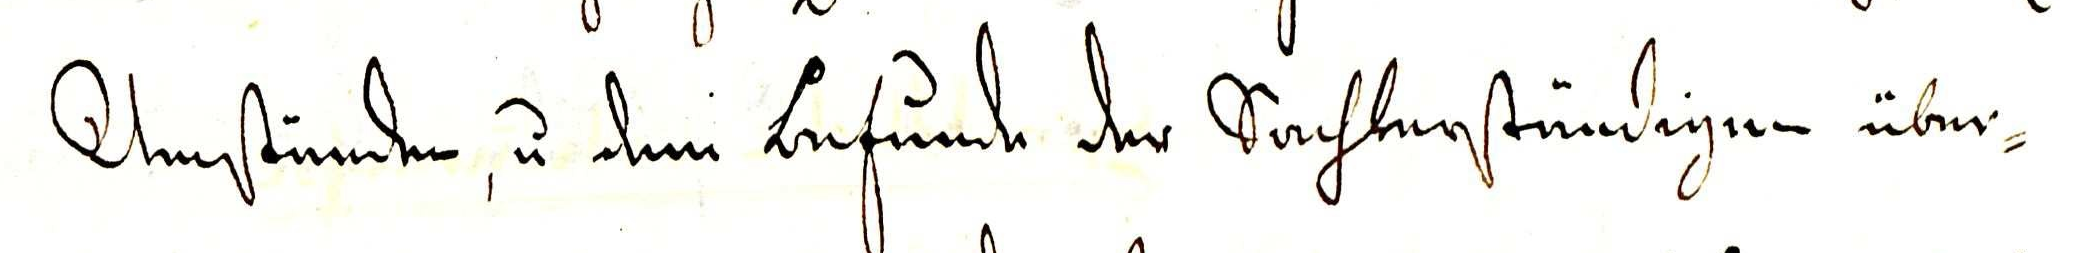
Umständen, u dem Befunde der Sachverständigen über¬
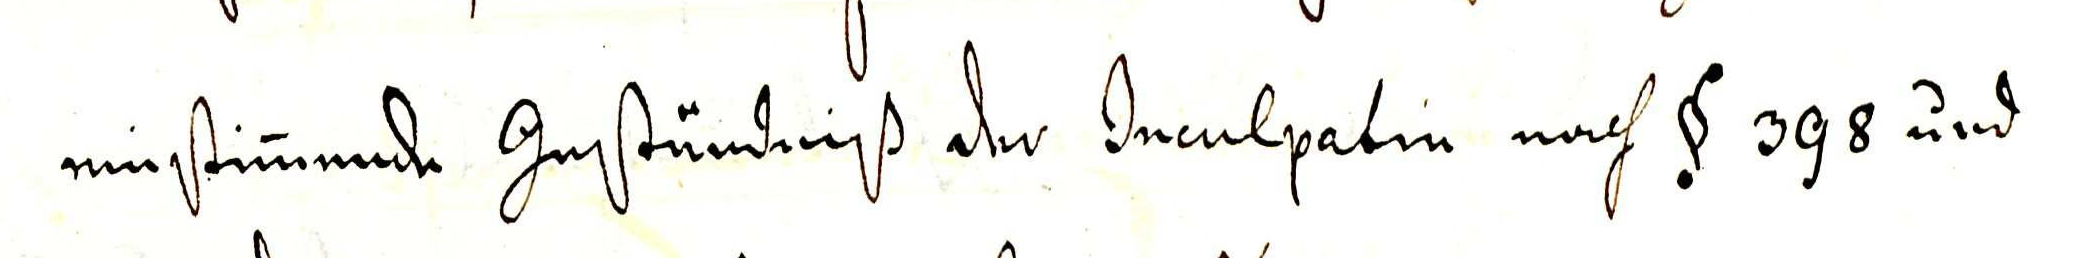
einstimmende Geständniß der Inculpatin nach §398 und
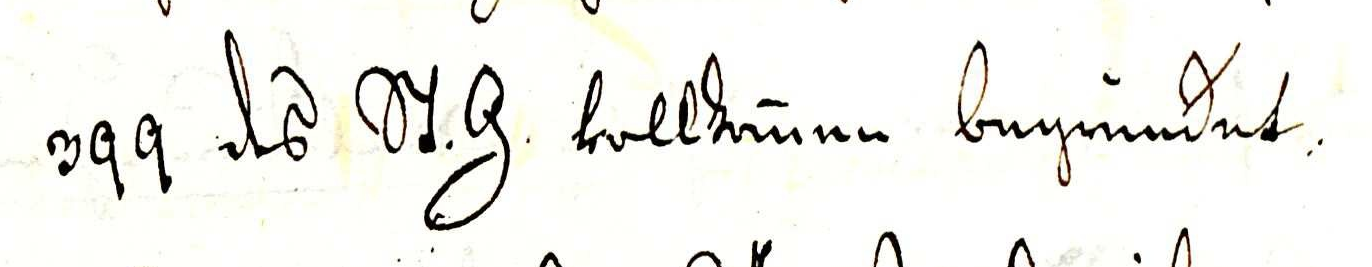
399 des St. G. vollkommen begründet.
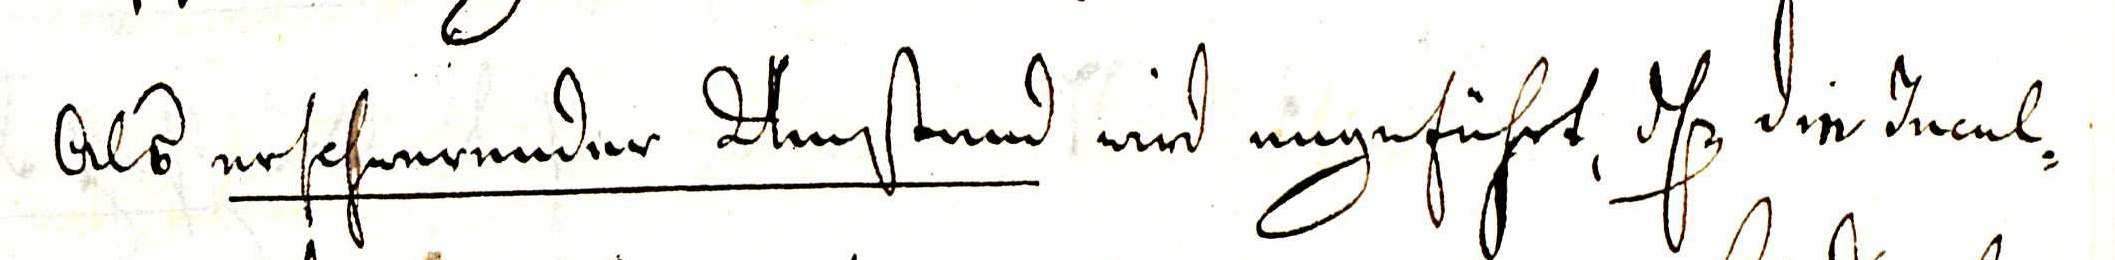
Als erschwerender Umstand wird angeführt, daß die Incul¬
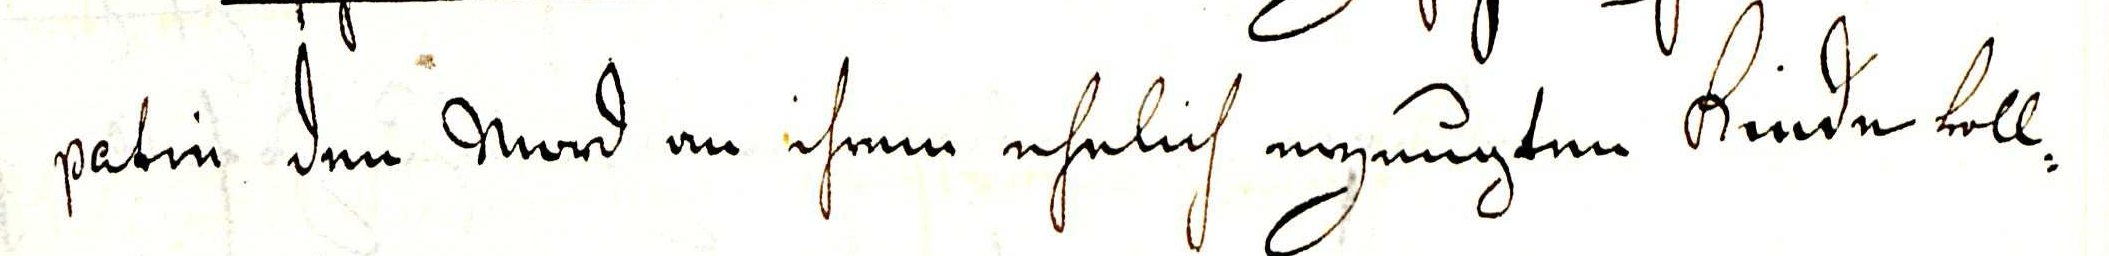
patin den Mord an ihrem ehelich erzeugten Kinde voll¬
